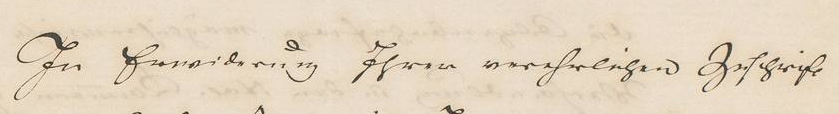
In Erwiderung Ihrer verehrlichen Zuschrift
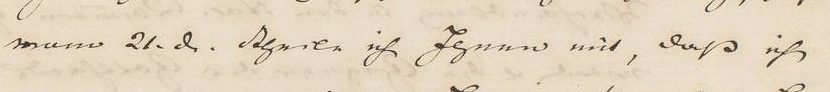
vom 21. d. theile ich Ihnen mit, daß ich
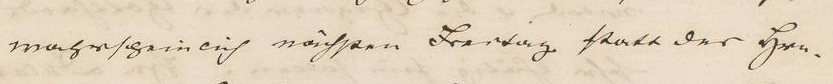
wahrscheinlich nächsten Freitag statt des Hrn.
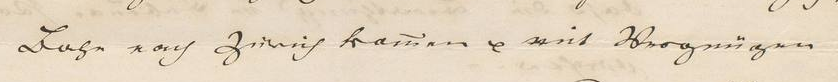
Bahn nach Zürich kommen & mit Vergnügen
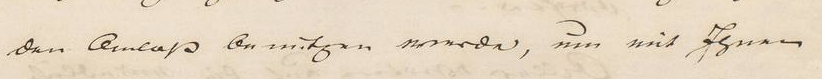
den Anlaß benutzen werde, um mit Ihnen
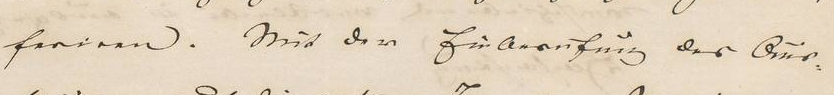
feriren. Mit der Einberufung des Aus-
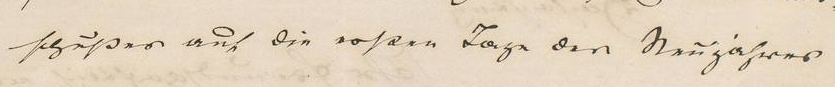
schußes auf die ersten Tage des Neujahres
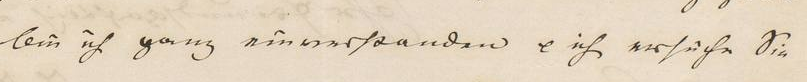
bin ich ganz einverstanden & ich ersuche Sie
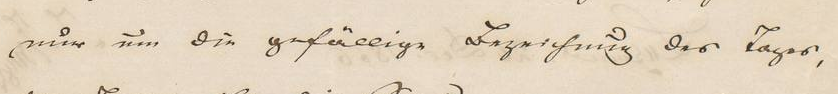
nur um die gefällige Bezeichnung des Tages,
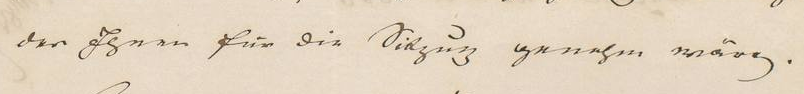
der Ihnen die für Sitzung genehm wäre.
